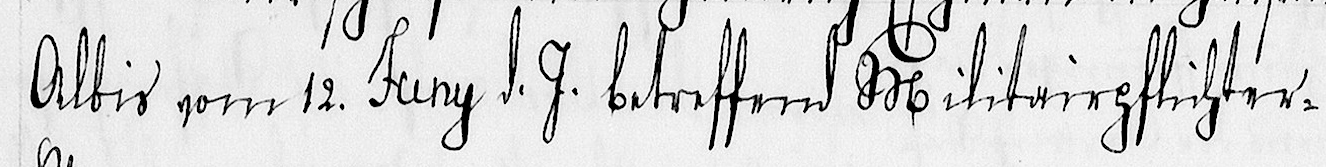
lbis vom 12. Juny d. J. betreffend Militairpflichter¬
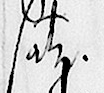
satz.
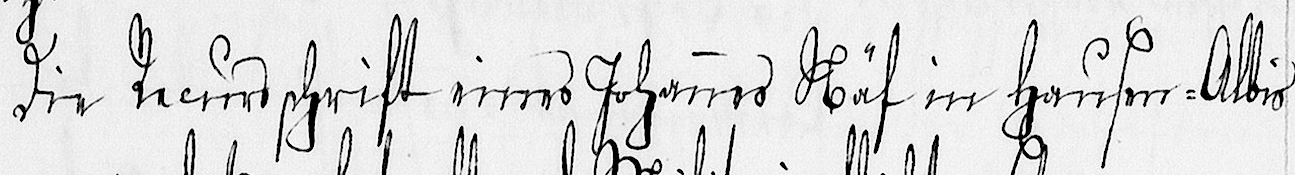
Die Recursschrift eines Johannes Näf in Hausen-Albis
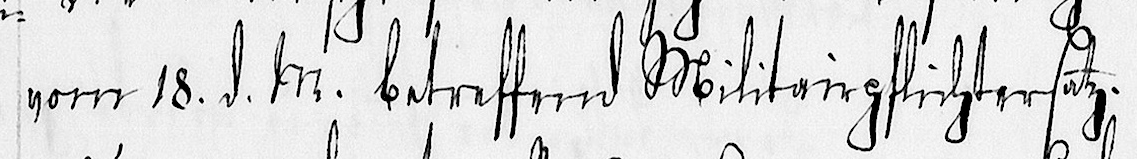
vom 18. d. M. betreffend Militairpflichtersatz.
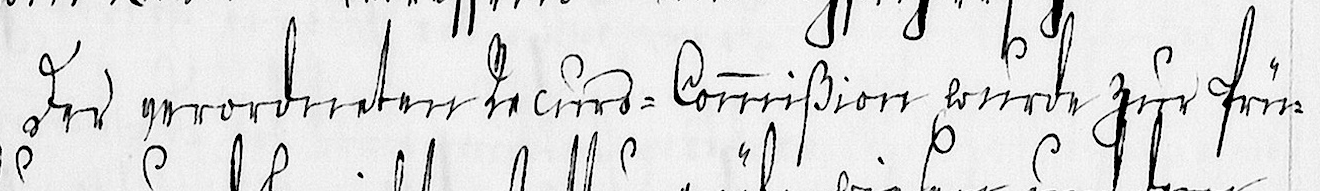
Der verordneten Recurs-Commißion wurde zur Prü¬
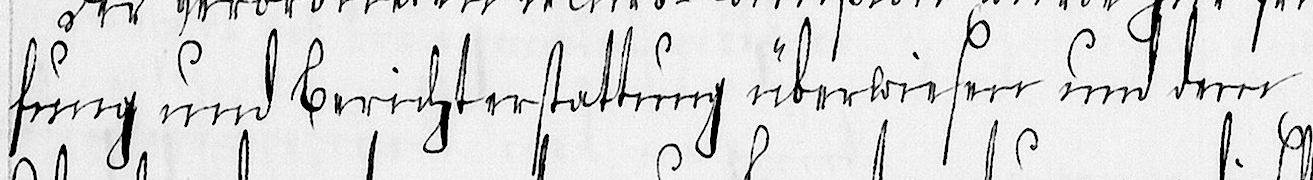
fung und Berichterstattung überwiesen und dem
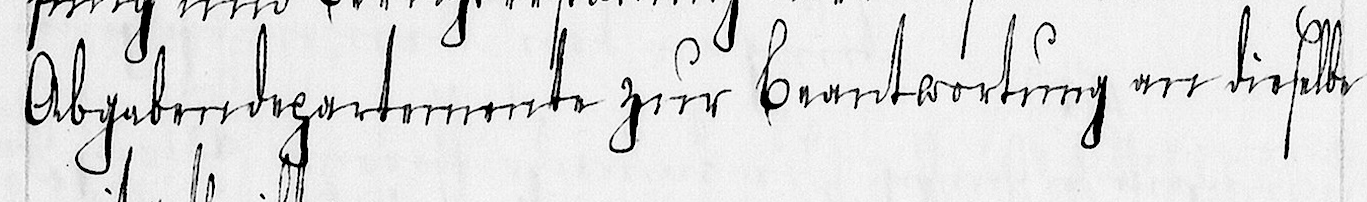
Abgabendepartemente zur Beantwortung an dieselbe
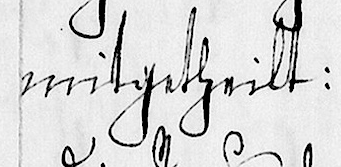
mitgetheilt:
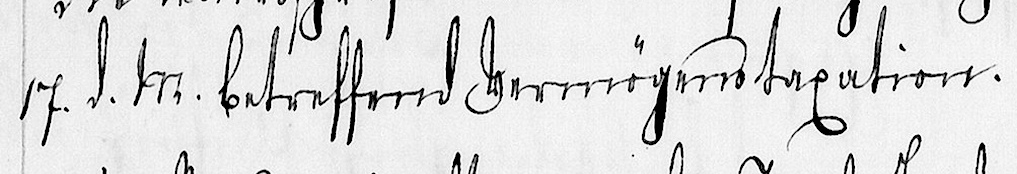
17. d. M. betreffend Vermögenstaxation.
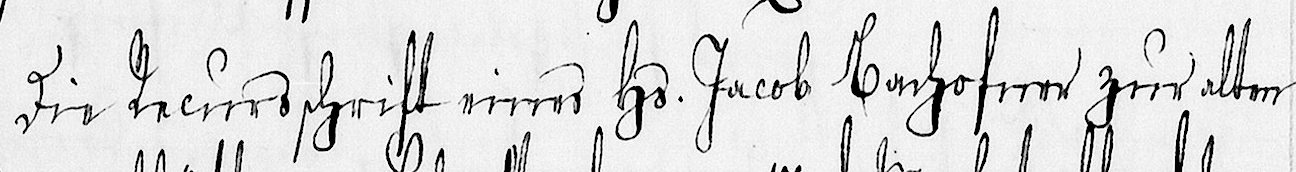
Die Recursschrift eines Hs. Jacob Bachofner zur alten
